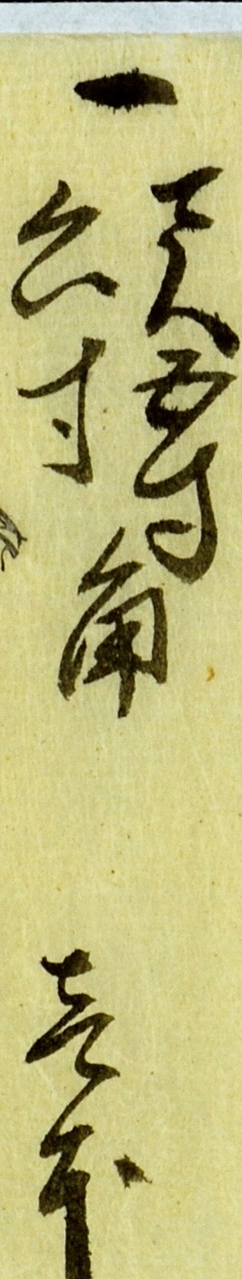一八寸角壱本
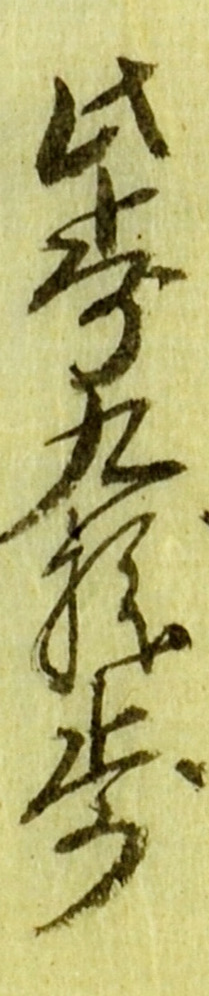此歩九拾歩
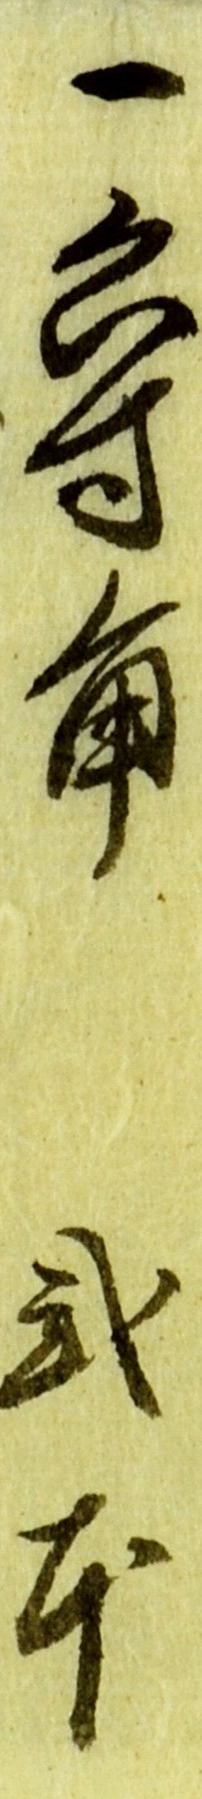一六寸角弐本
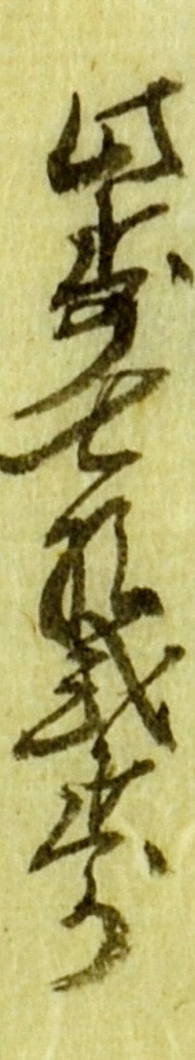此歩七拾弐歩
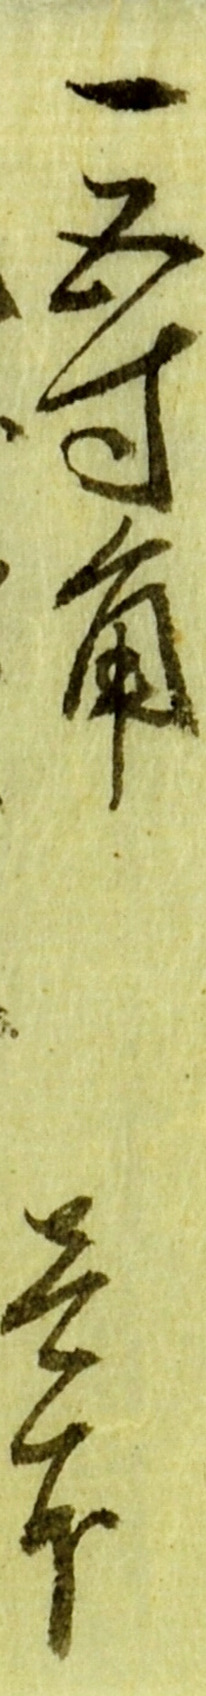一五寸角壱本
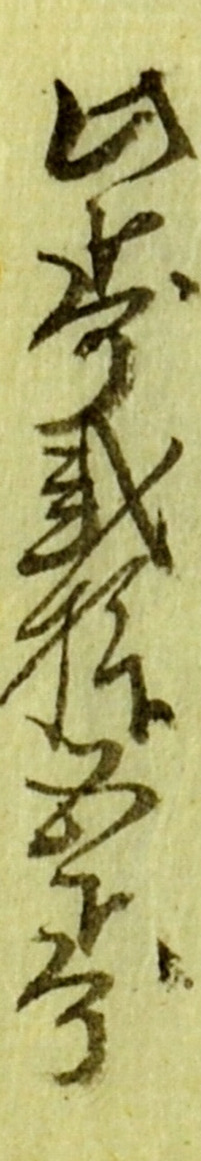此歩弐拾五歩

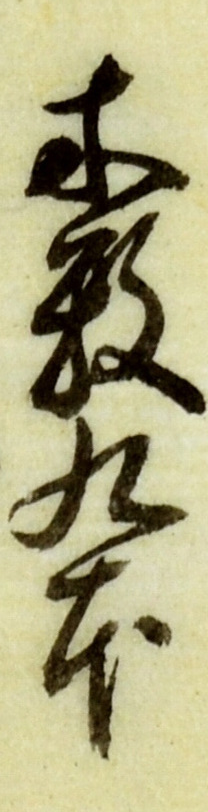木数九本
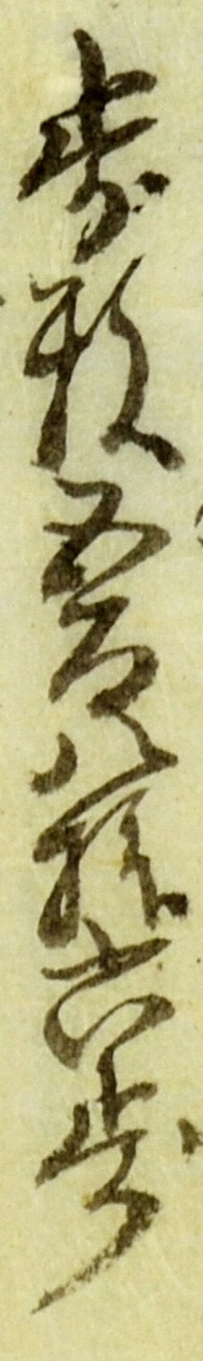〆歩数五反八拾六歩
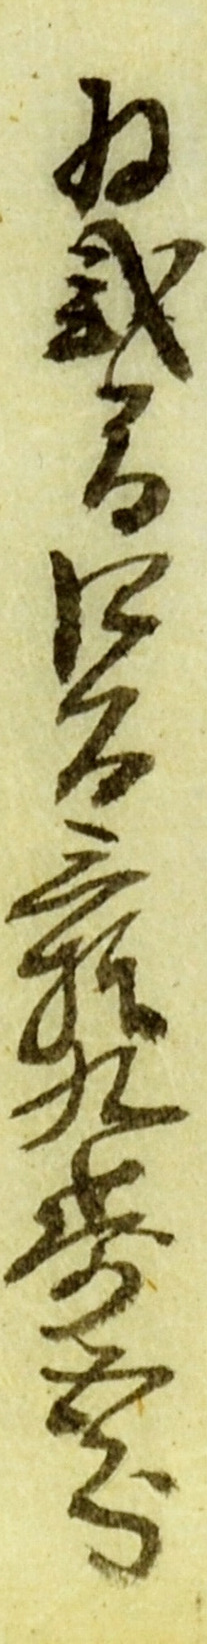為弐間四百三拾九歩五分
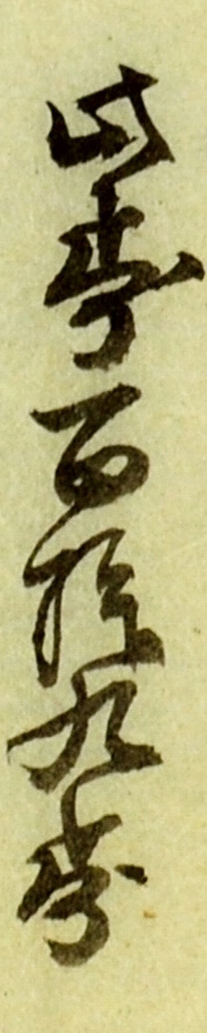此歩百拾九歩
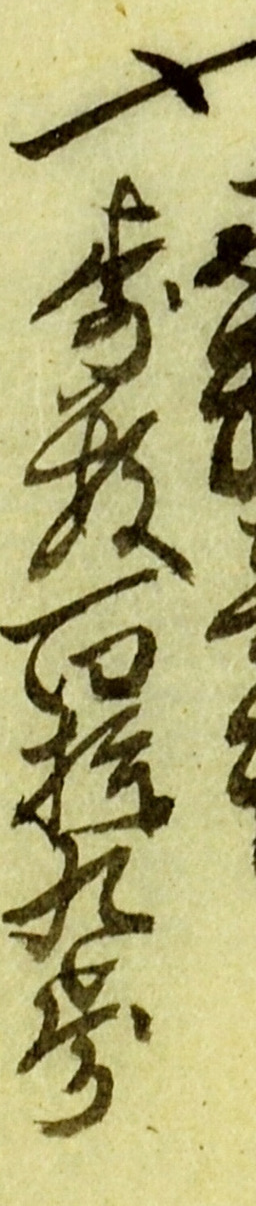〆歩数百拾九歩
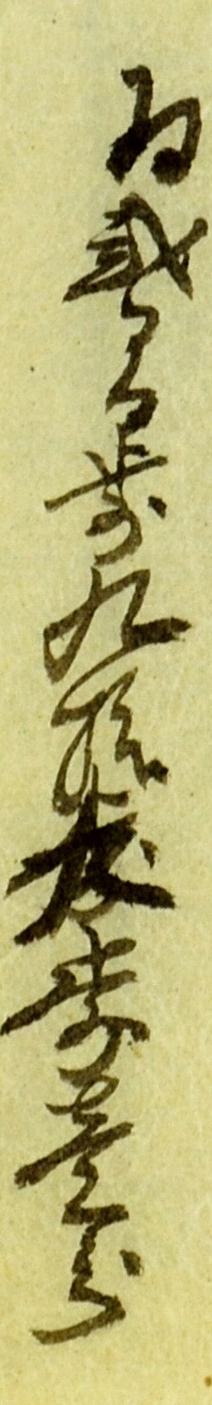為弐間歩九拾九歩壱分
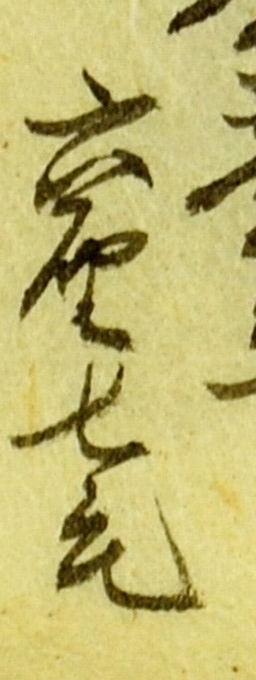六厘七毛
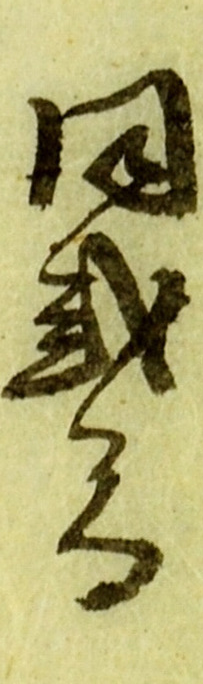同弐間
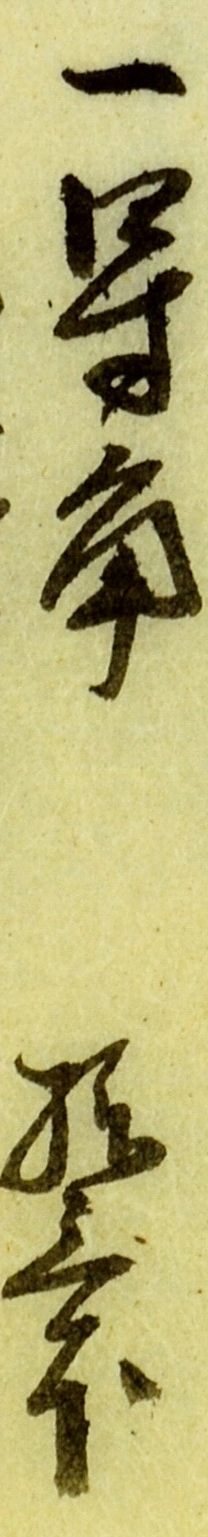一四寸角拾三本
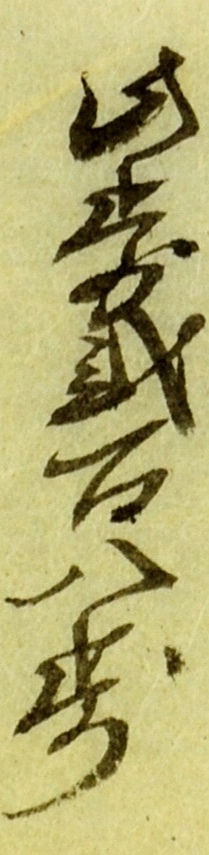此歩弐百八歩
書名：材木川下ケ分一上納帳
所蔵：伊那市立高遠町図書館・合同会社AMANE
